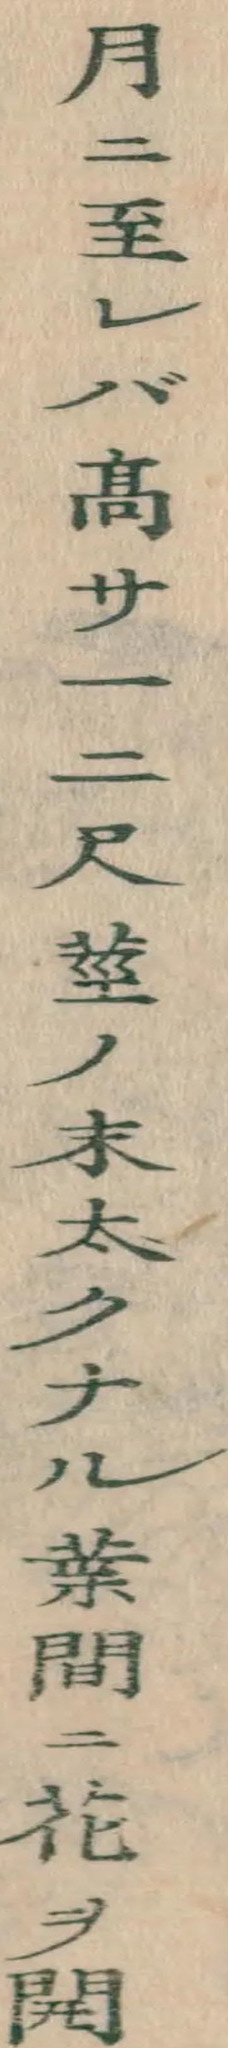月ニ至レバ高サ一二尺茎ノ末太クナル葉間ニ花ヲ開
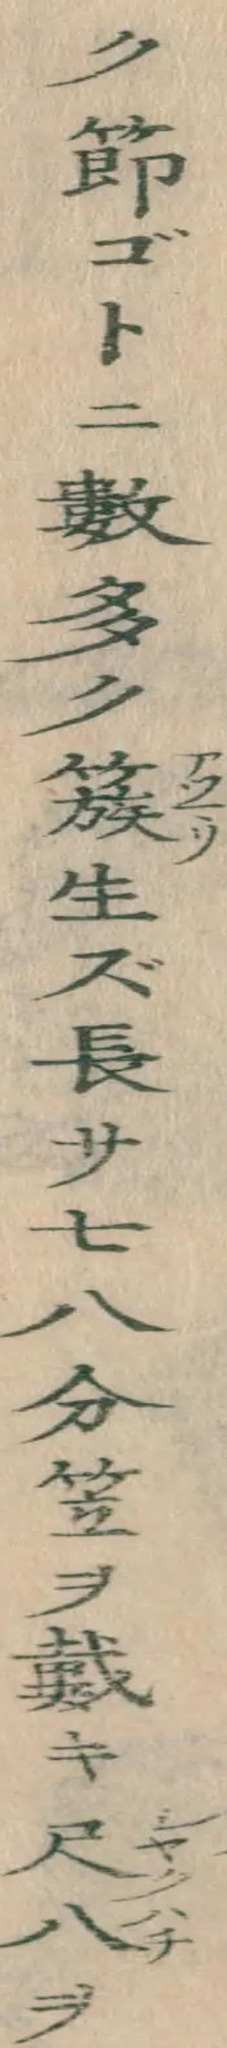ク節ゴトニ数多ク簇生ズ長サ七八分笠ヲ戴キ尺八ヲ
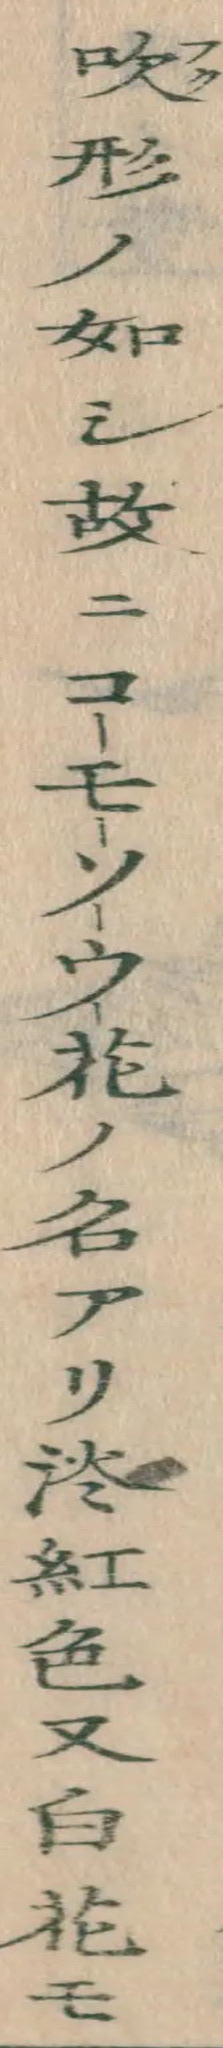吹形ノ如シ故ニコ-モ-ソ-ウ-花ノ名アリ淡紅色又白花モ
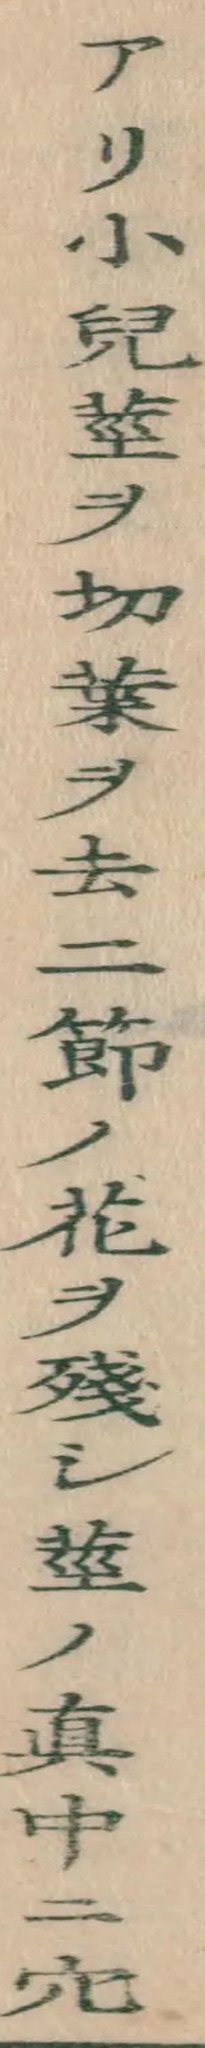アリ小児茎ヲ切葉ヲ去二節ノ花ヲ残シ茎ノ真中ニ穴
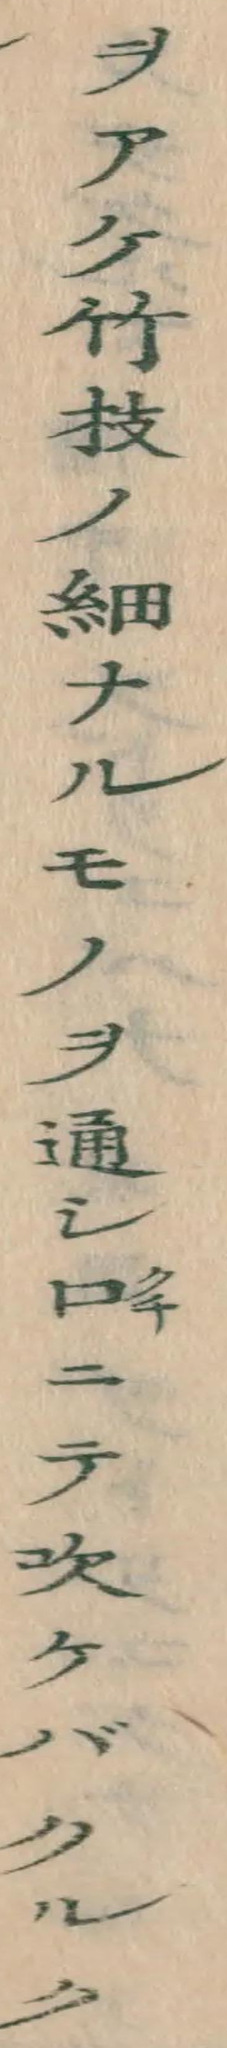ヲアケ竹枝ノ細ナルモノヲ通シ口ニテ吹ケバクルク
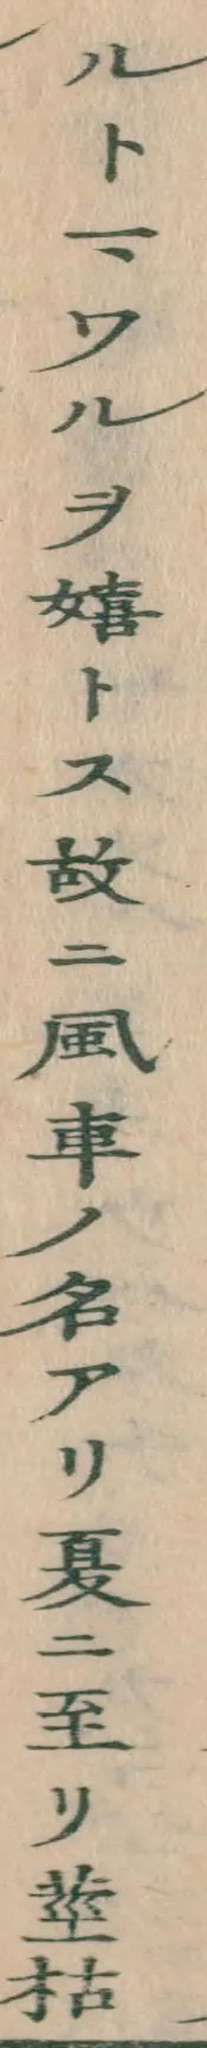ルトマワルヲ嬉トス故ニ風車ノ名アリ夏ニ至リ茎枯
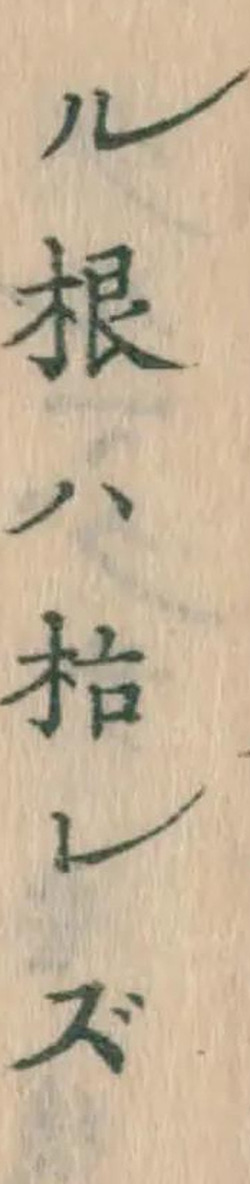ル根ハ枯レズ
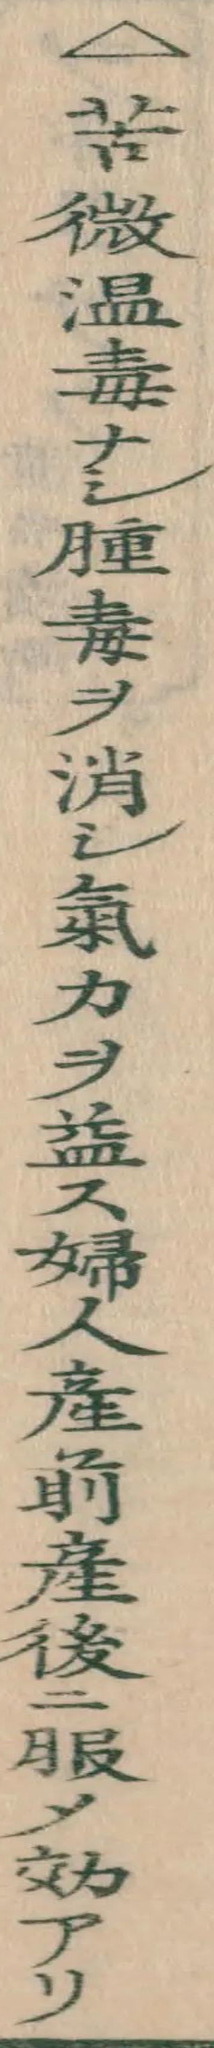△苦微温毒ナシ腫毒ヲ消シ気力ヲ益ス婦人産前産後ニ服シテ効アリ

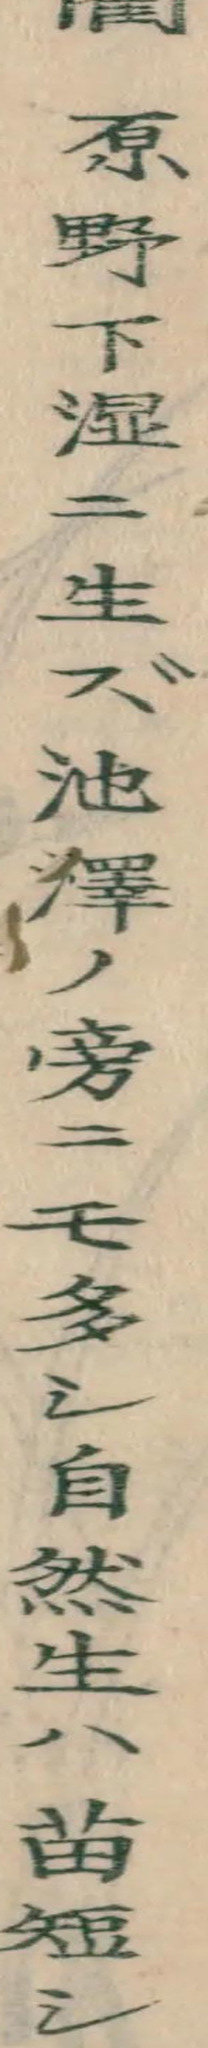藺原野下湿ニ生ズ池沢ノ旁ニモ多シ自然生ハ苗短シ
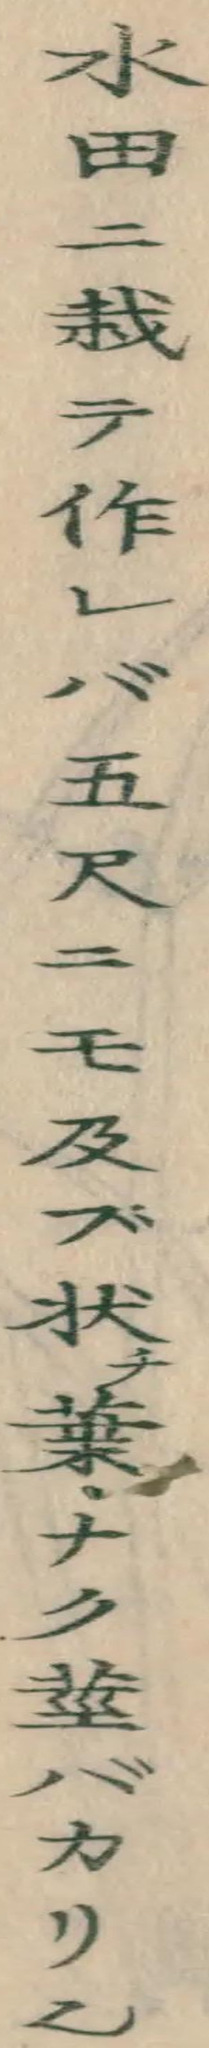水田ニ栽テ作レバ五尺ニモ及ブ状葉ナク茎バカリ也
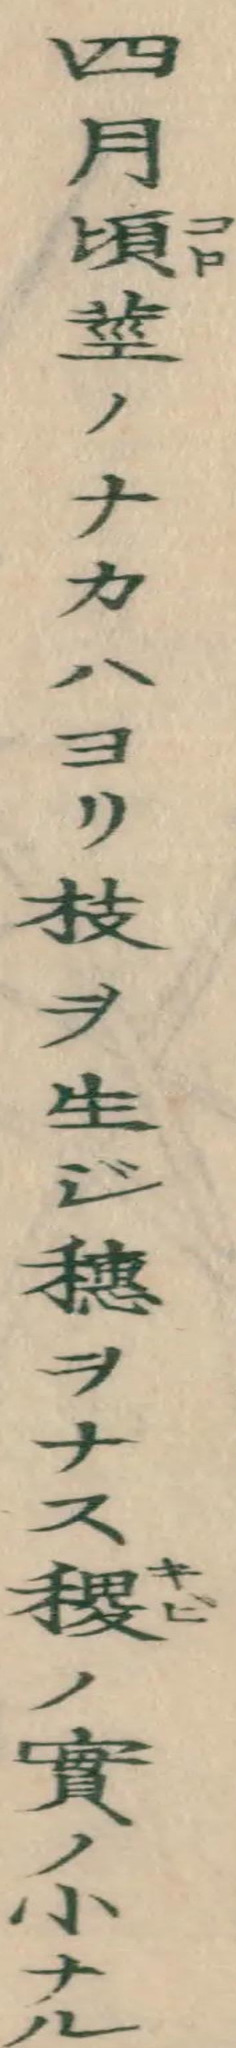四月頃茎ノナカハヨリ枝ヲ生ジ穂ヲナス稷ノ実ノ小ナル
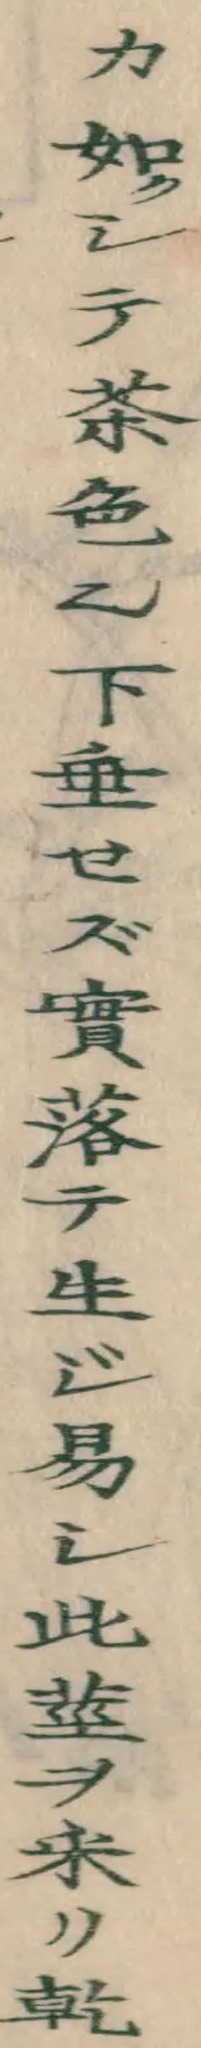カ如シテ茶色也下垂セズ実落テ生ジ易シ此茎ヲ采リ乾
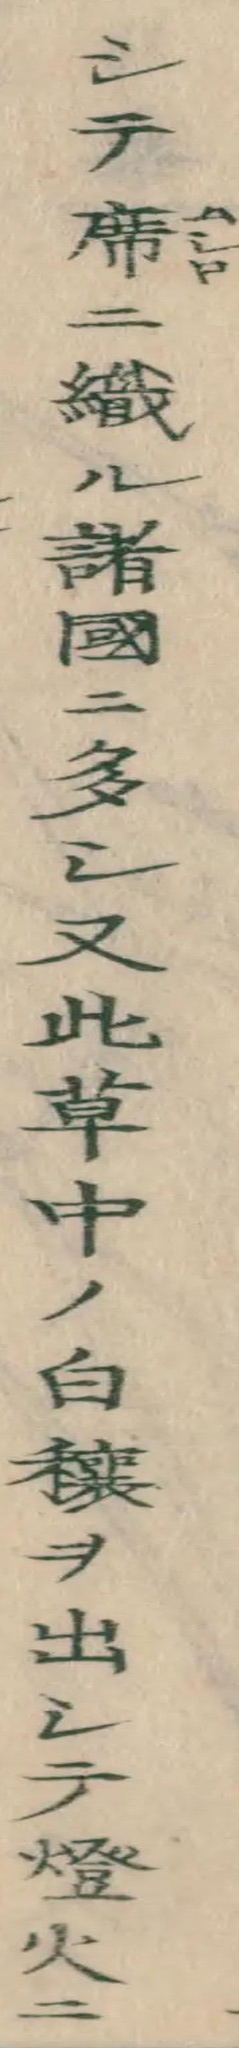シテ席ニ織ル諸国ニ多シ又此草中ノ白穣ヲ出シテ燈火ニ
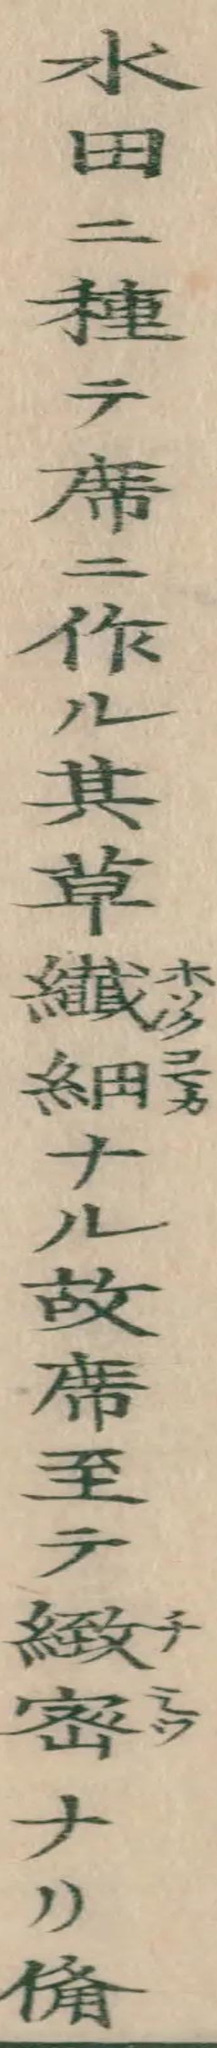水田ニ種テ席ニ作ル其草繊細ナル故席至テ緻密ナリ
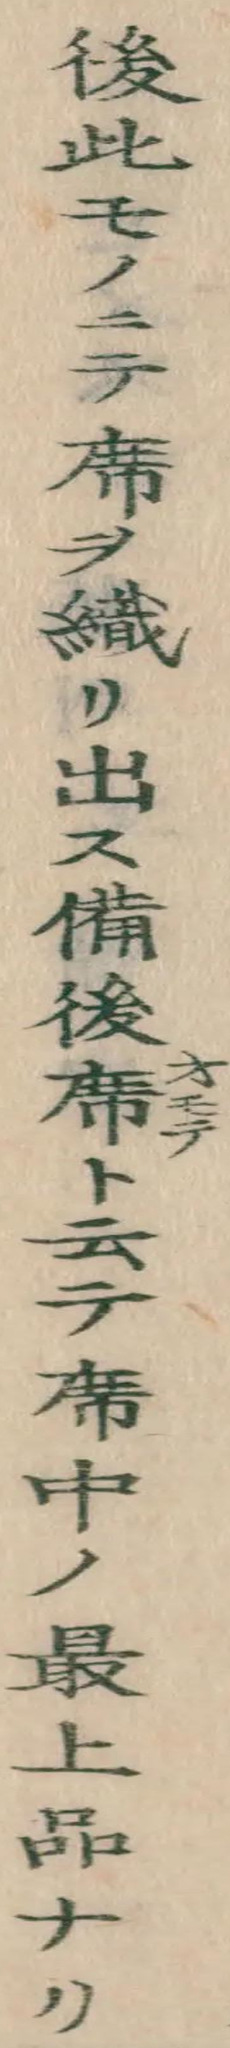後此モノニテ席ヲ織リ出ス備後席ト云テ席中ノ最上品ナリ
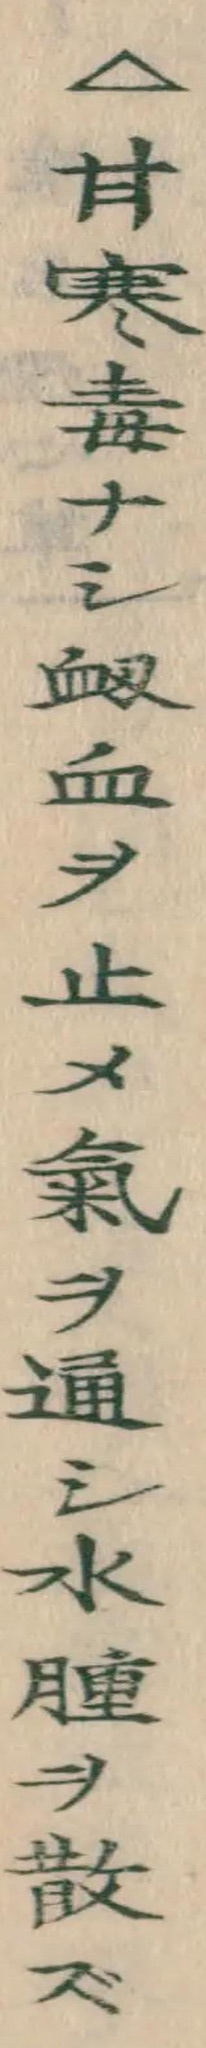△甘寒毒ナシ衄血ヲ止メ気ヲ通シ水腫ヲ散ズ
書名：これこれ草 2巻. [2]
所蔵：国立国会図書館 National Diet Library, JAPAN
